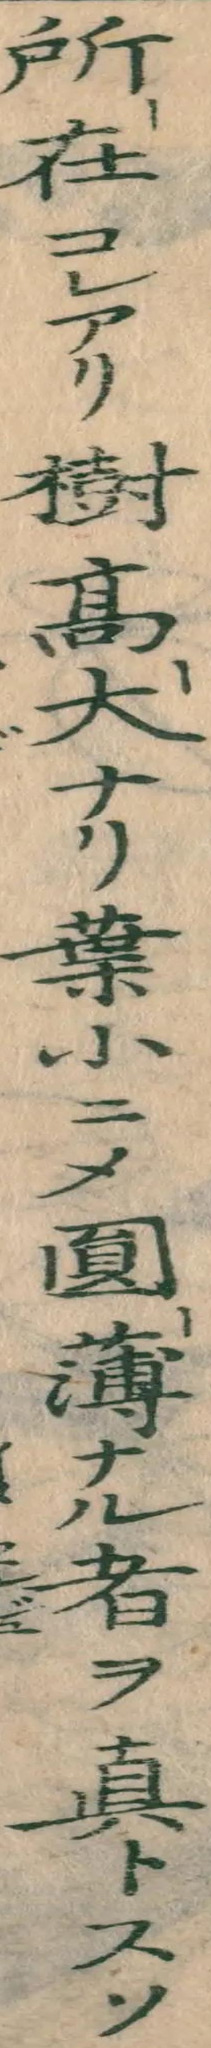所-在コレアリ樹高-大ナリ葉小ニシテ円-薄ナル者ヲ真トスソ
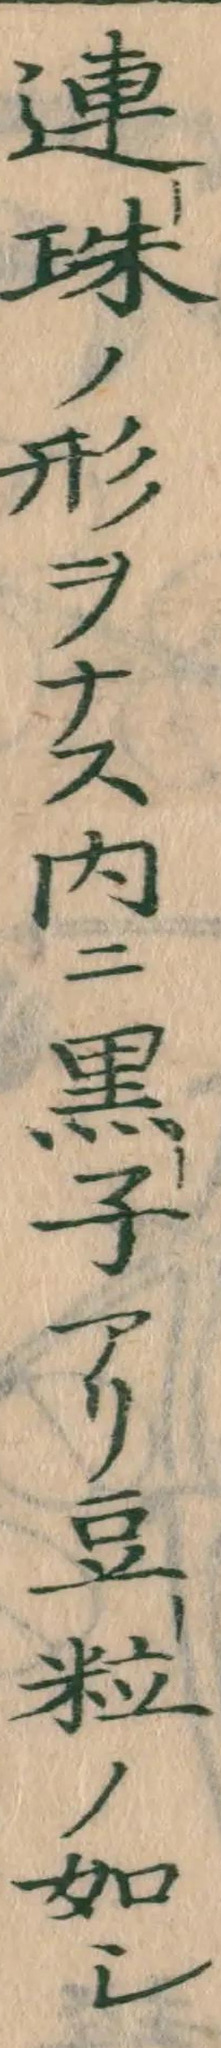連-珠ノ形ヲナス内ニ黒-子アリ豆-粒ノ如シ

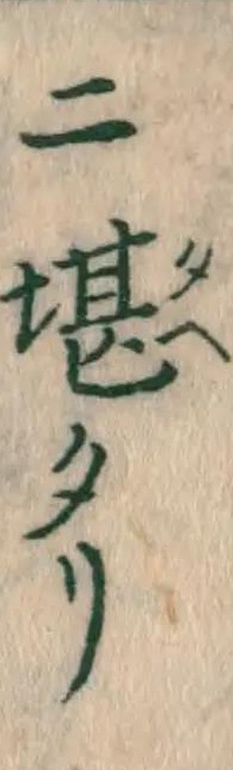ニ堪タリ

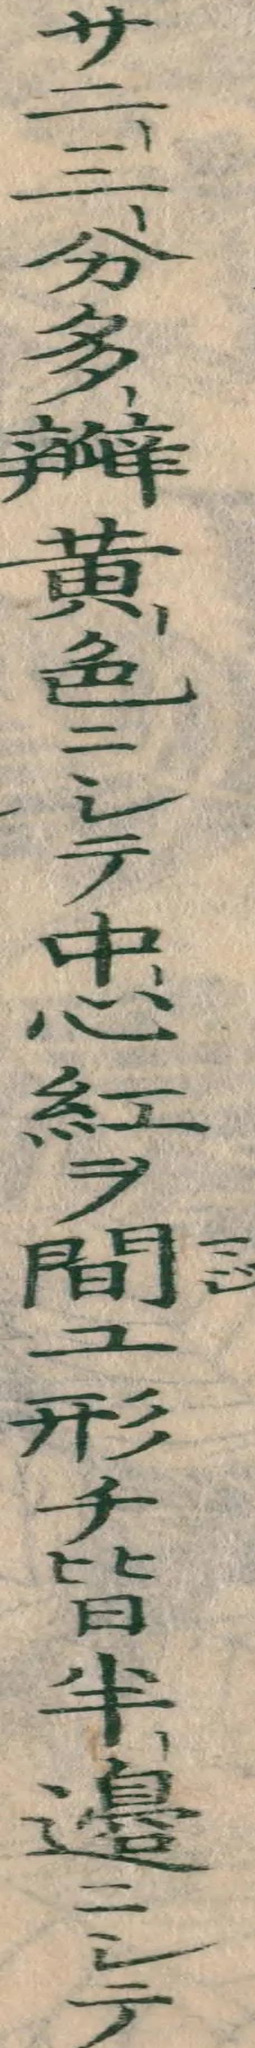サ二-三-分多-弁黄-色ニシテ中-心紅ヲ間ユ形チ皆半-辺ニシテ
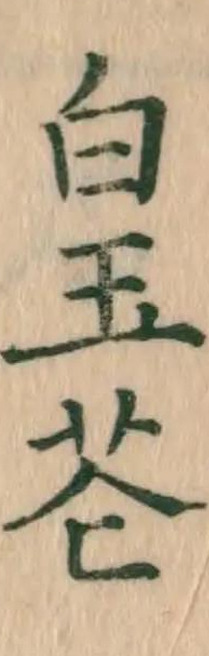白玉花

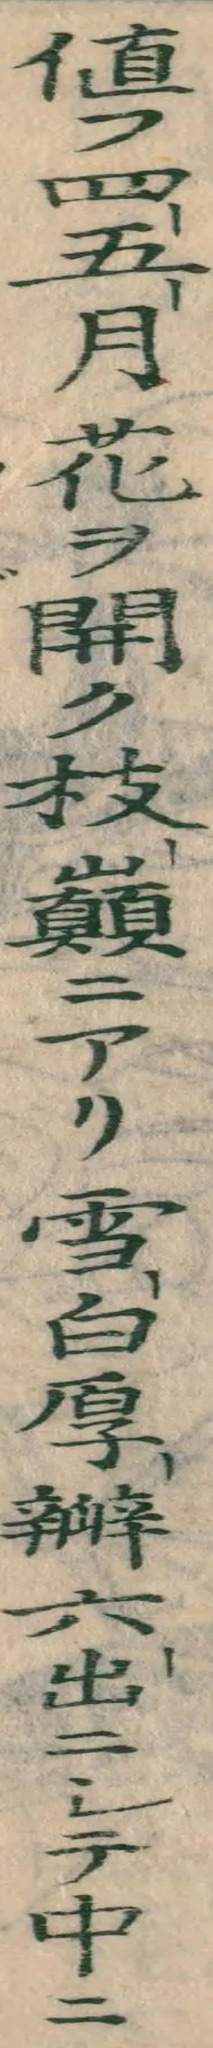値フ四-五-月花ヲ開ク枝-巓ニアリ雪-白厚-弁六-出ニシテ中ニ
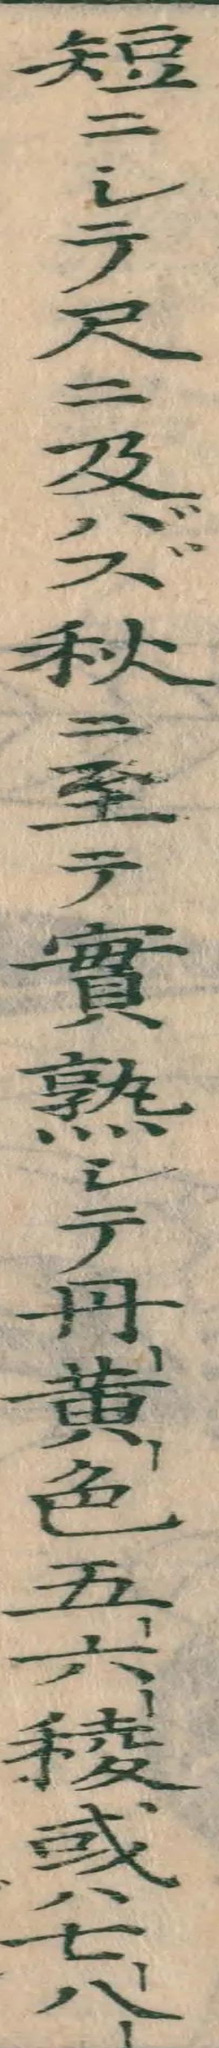短ニシテ尺ニ及バズ秋ニ至テ実熟シテ丹-黄-色五-六-稜或ハ七-八-
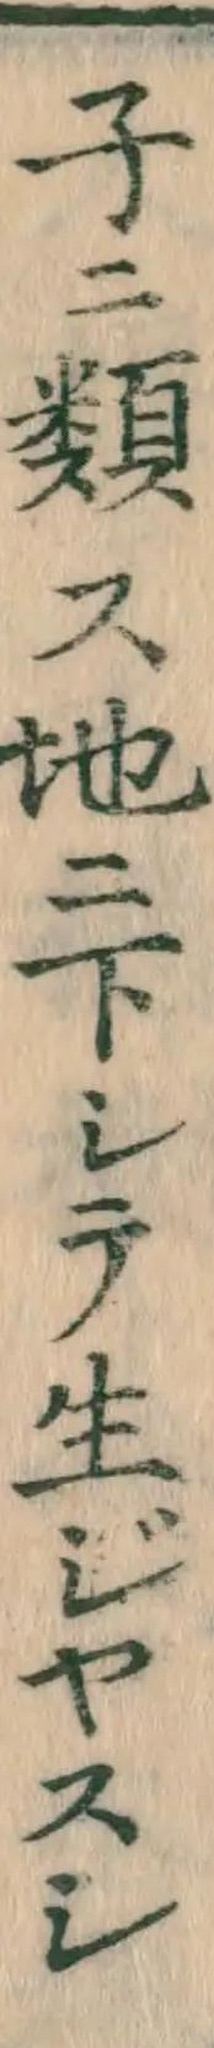子ニ類ス地ニ下シテ生ジヤスシ

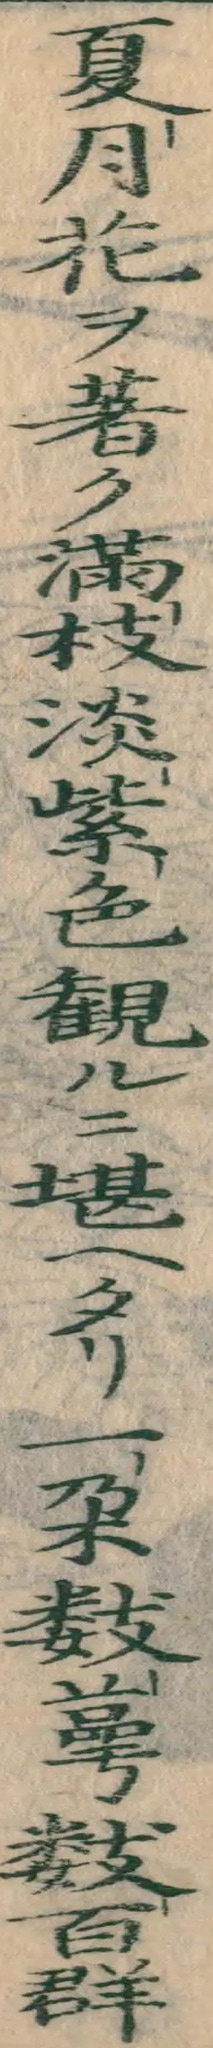夏-月花ヲ著ク満-枝淡-紫-色観ルニ堪ヘタリ一-朶数-萼数-百群
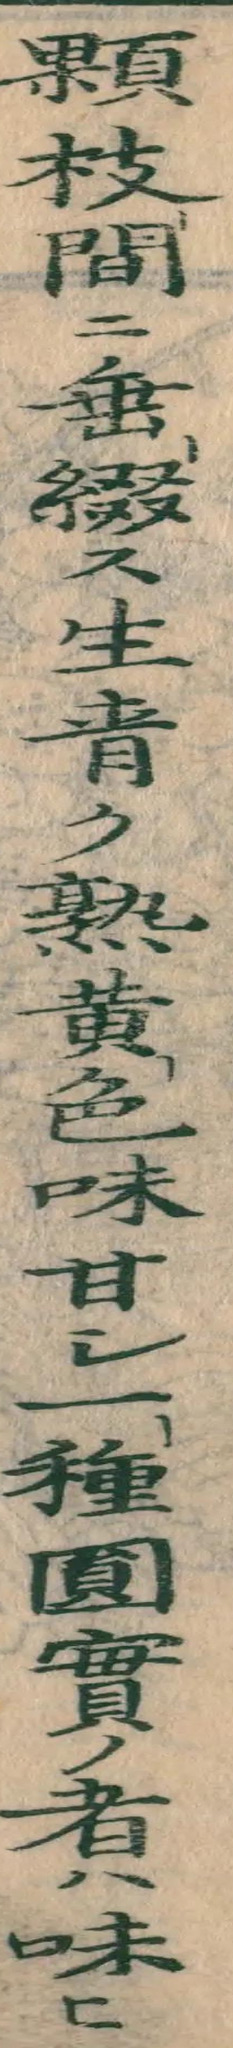顆枝-間ニ垂-綴ス生青ク熟黄-色味甘シ一-種円実ノ者ハ味ヒ
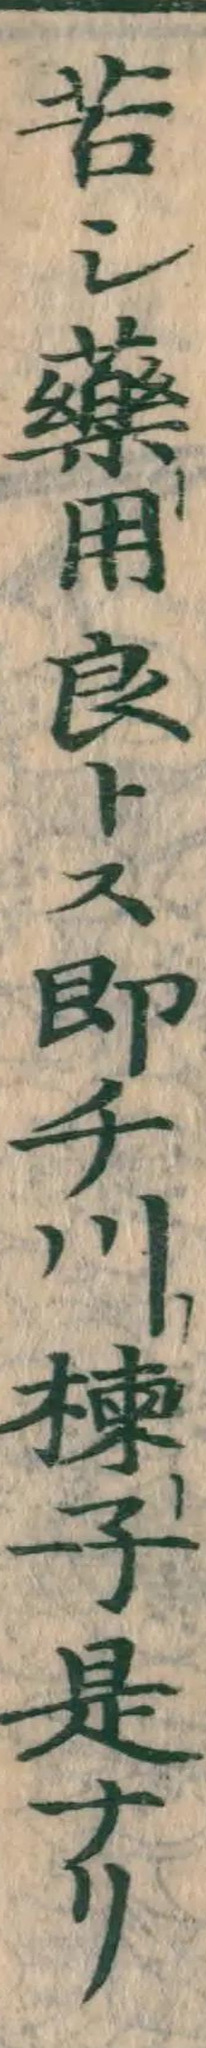苦シ薬-用良トス即チ川-楝-子是ナリ
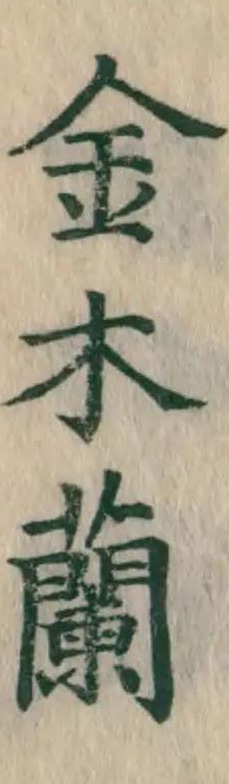金木蘭

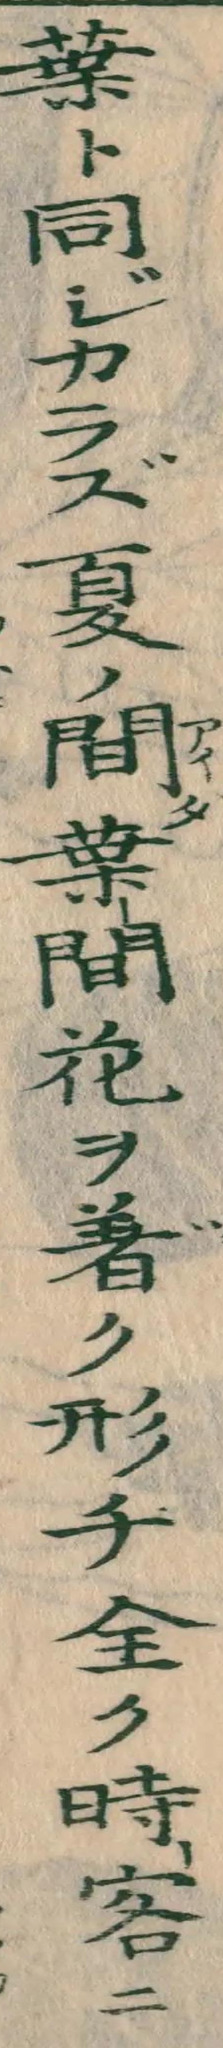葉ト同ジカラズ夏ノ間葉-間花ヲ着ク形チ全ク時-客ニ

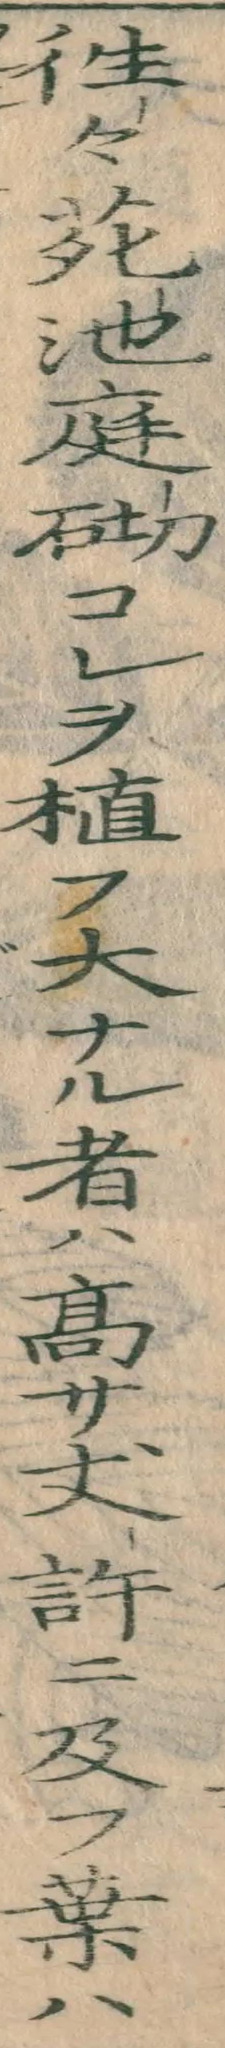往-々苑-池庭-砌コレヲ植フ大ナル者ハ高サ丈-許ニ及フ葉ハ
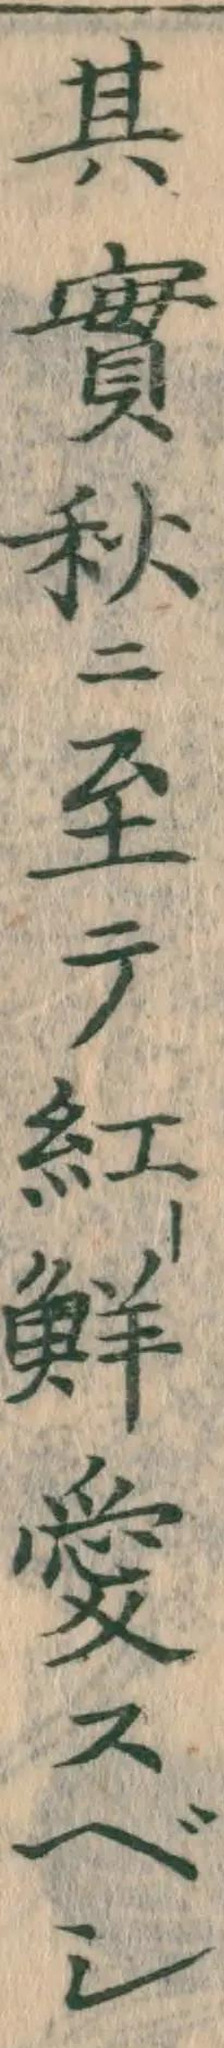其実秋ニ至テ紅-鮮愛スベシ
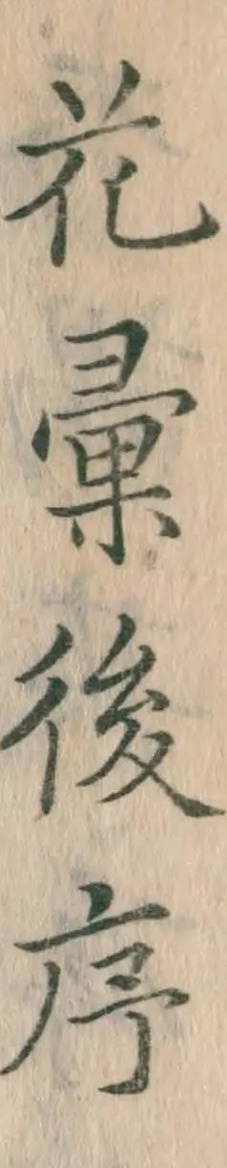花彙後序
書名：花彙 草部4巻木部4巻. [2]
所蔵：国立国会図書館 National Diet Library, JAPAN
